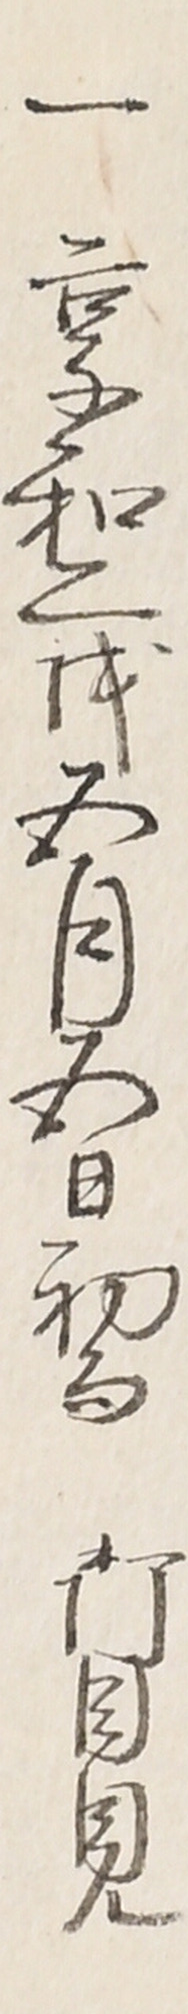一享和二戊五月五日初而御目見
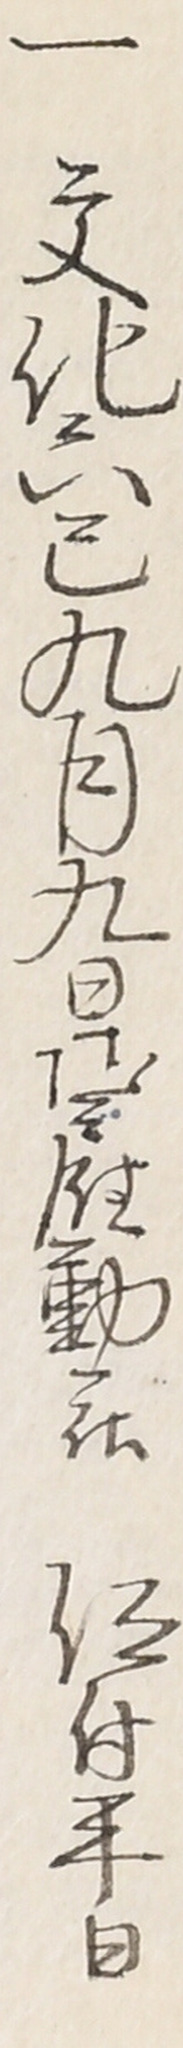一文化六巳九月九日御雇勤被仰付平日
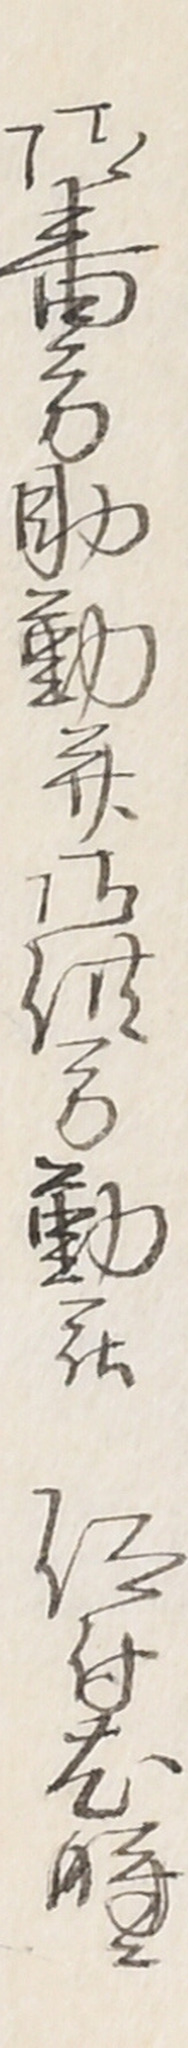御番方助勤并御供方勤被仰付尤時ニ
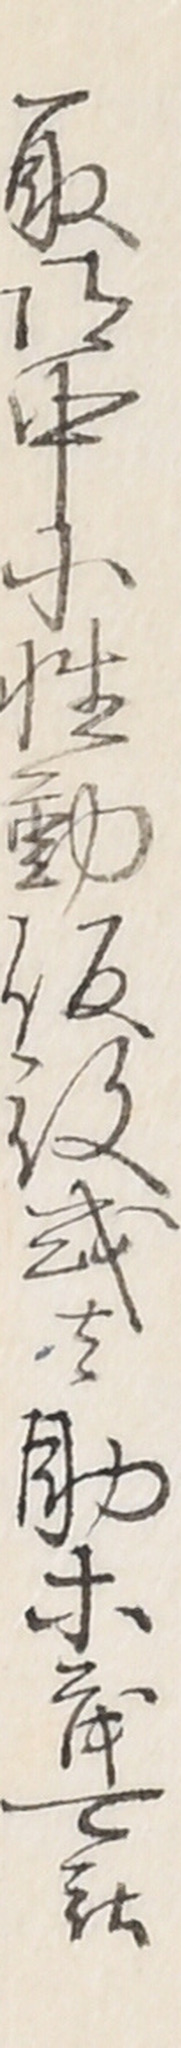取御中小性勤仮役式は助等も可被
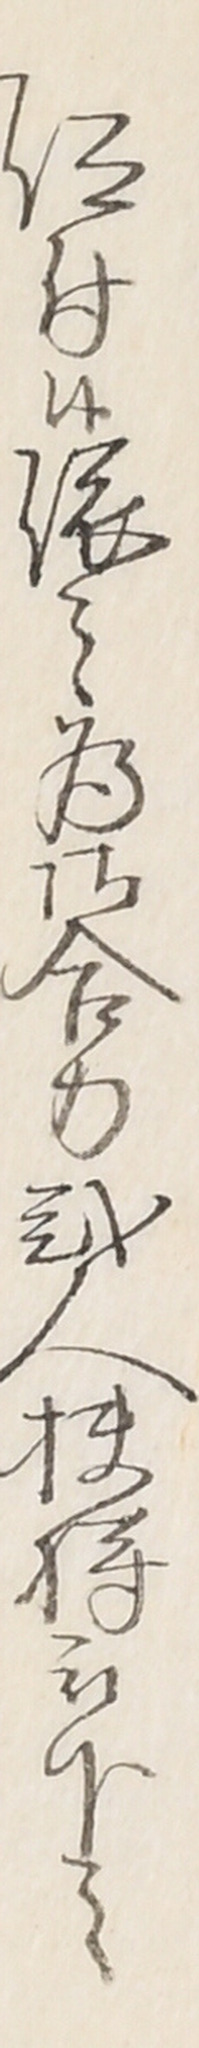仰付候依之為御合力弐人扶持被下之
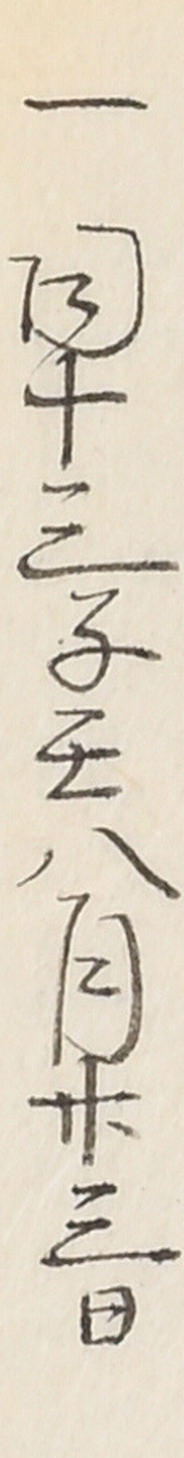一同十三子閏八月廿三日
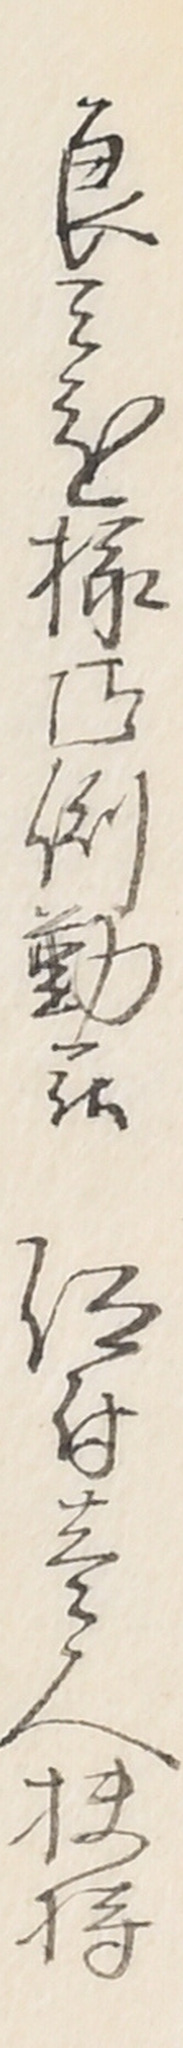良之進様御側勤被仰付壱人扶持
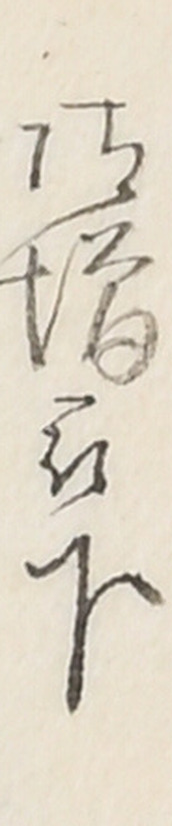御増被下
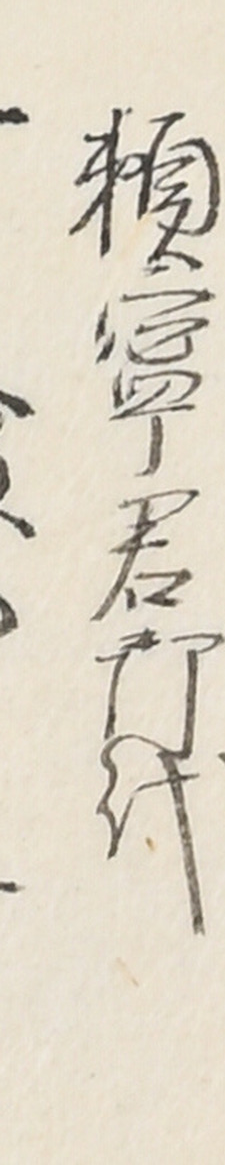頼寧君御代
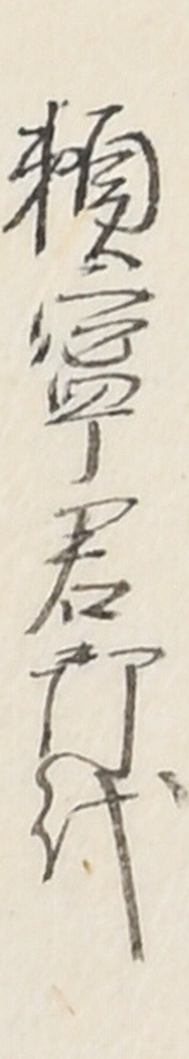頼寧君御代
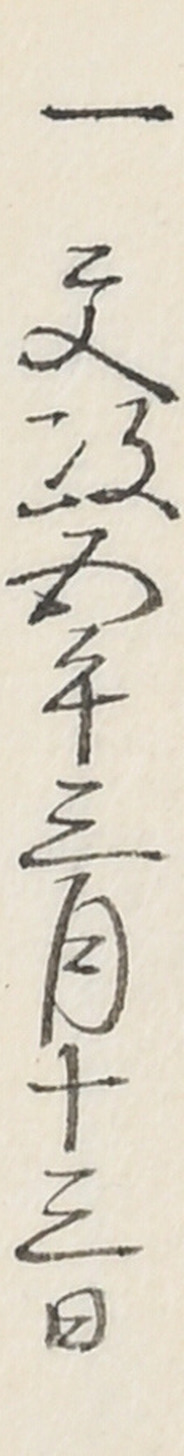一文政五午三月十三日
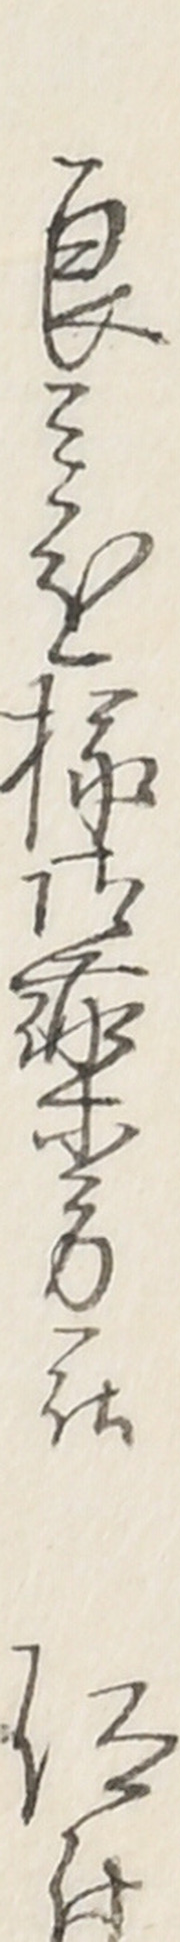良之進様御薬方被仰付
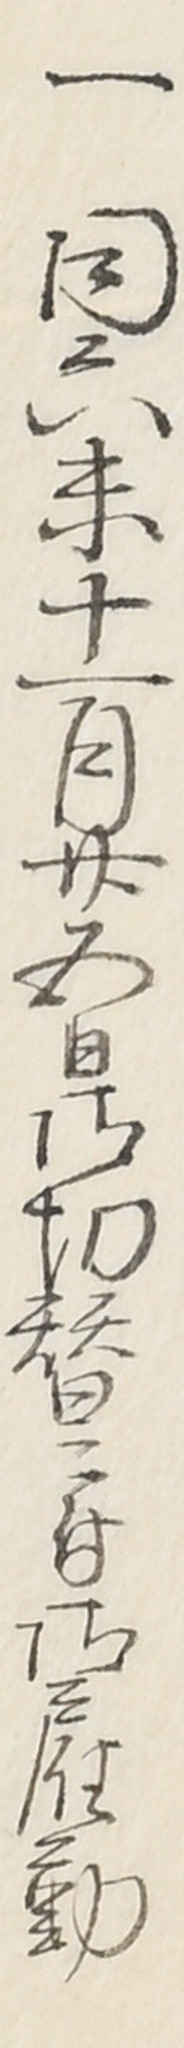一同六未十一月廿五日御切替ニ付御雇勤
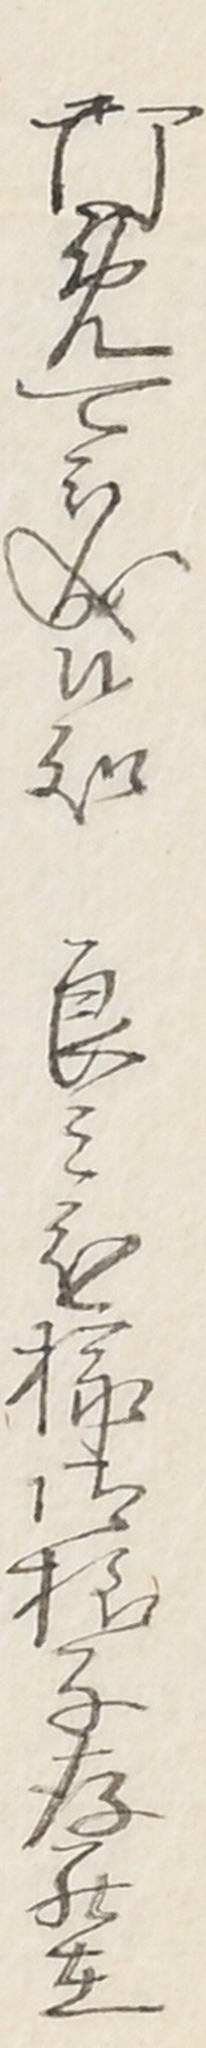御免可被成候処良之進様御様子存罷在
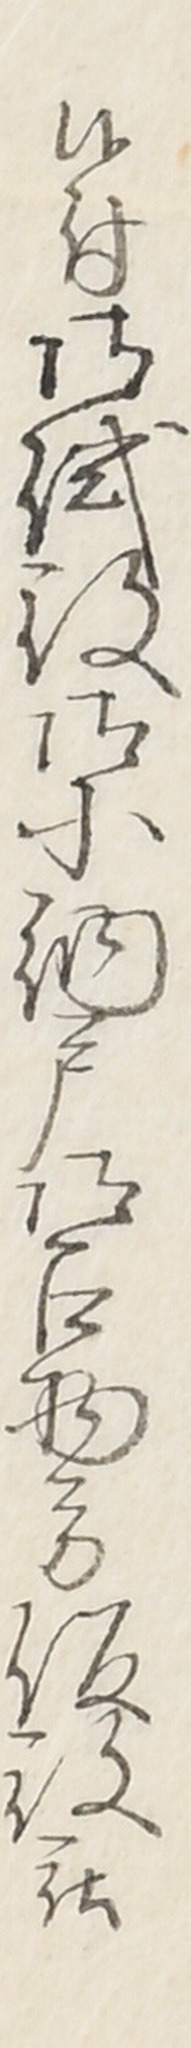候付御試役御小納戸御召物方仮役被
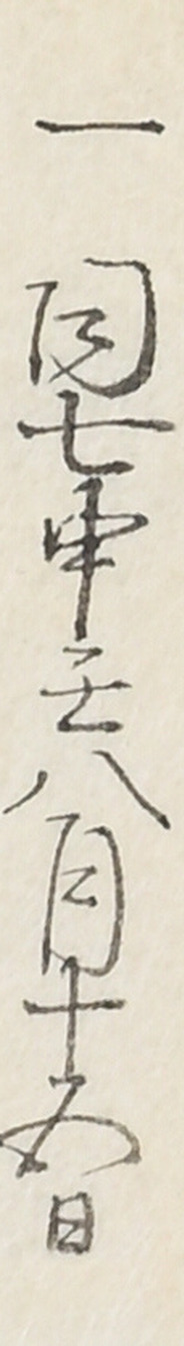一同七申閏八月十五日
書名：給人諸士勤仕録（七）
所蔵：伊那市立高遠町図書館・合同会社AMANE
